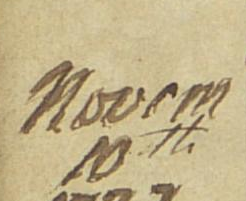Novem^r
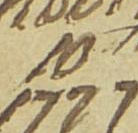10^th
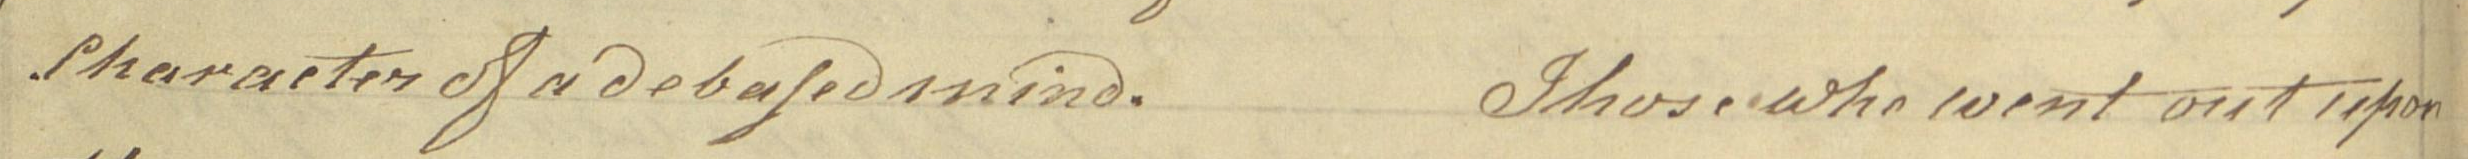character of a debased mind. Those who went out upon
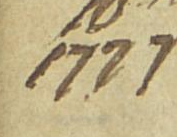1777
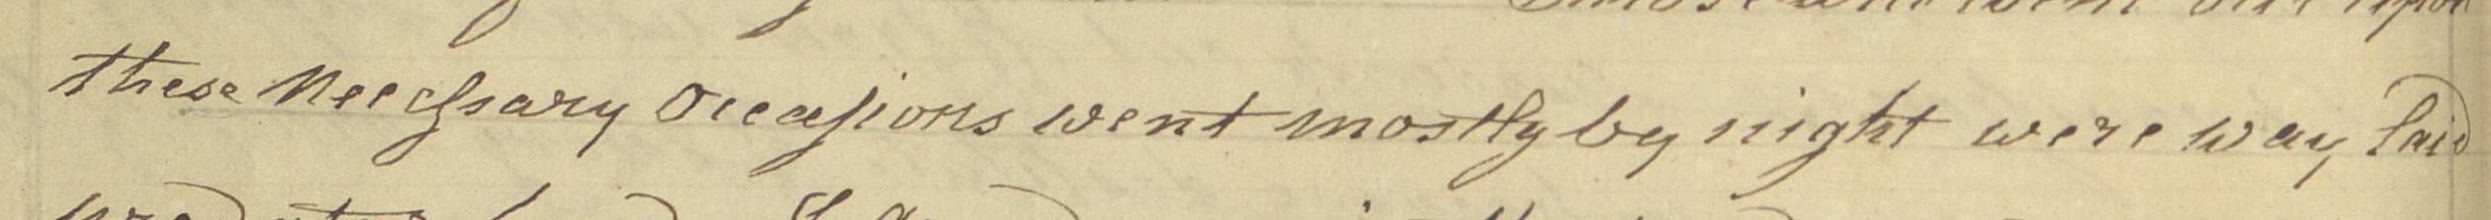these Necessary Occasions went mostly by night were way laid
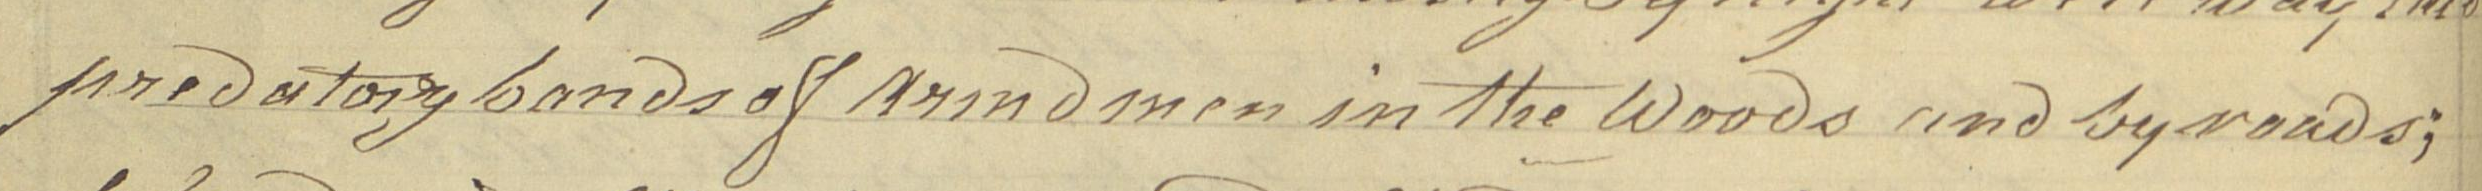predatory bands of armdmen in the Woods and by roads;
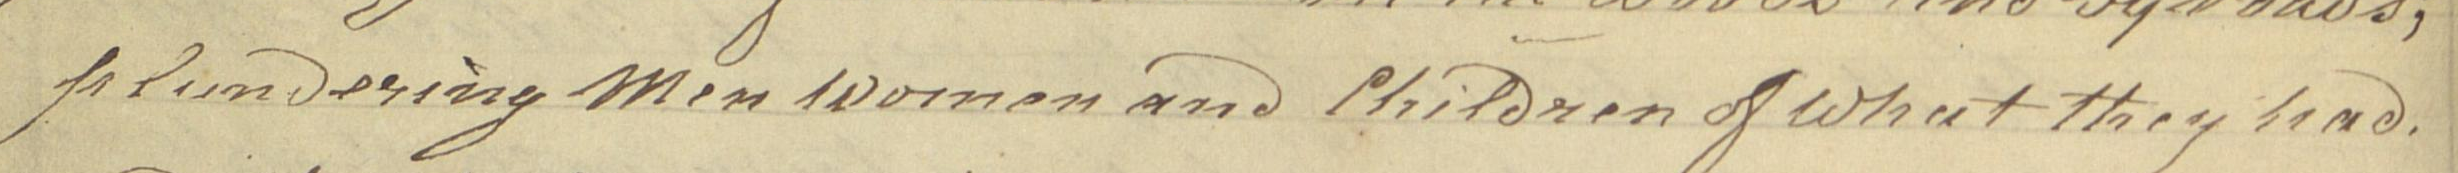plundering Men women and Children of what they had.
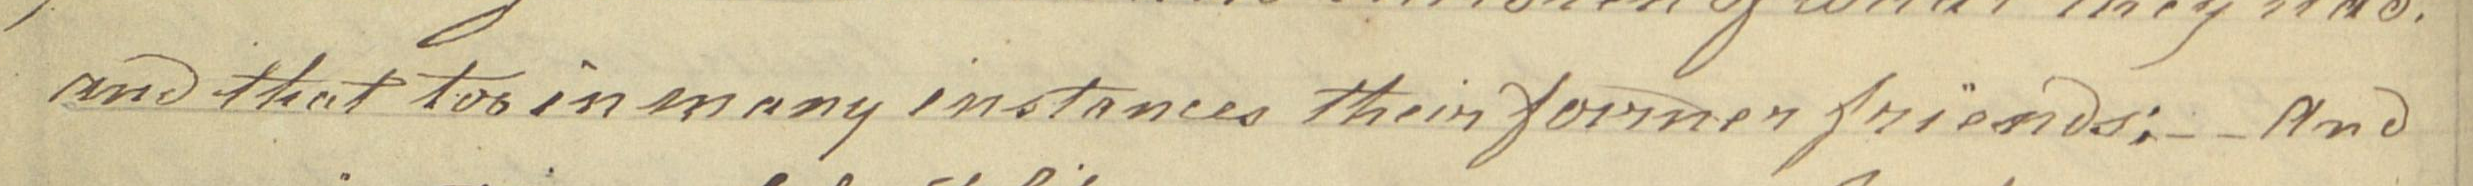and that too in many instances their former friends; And
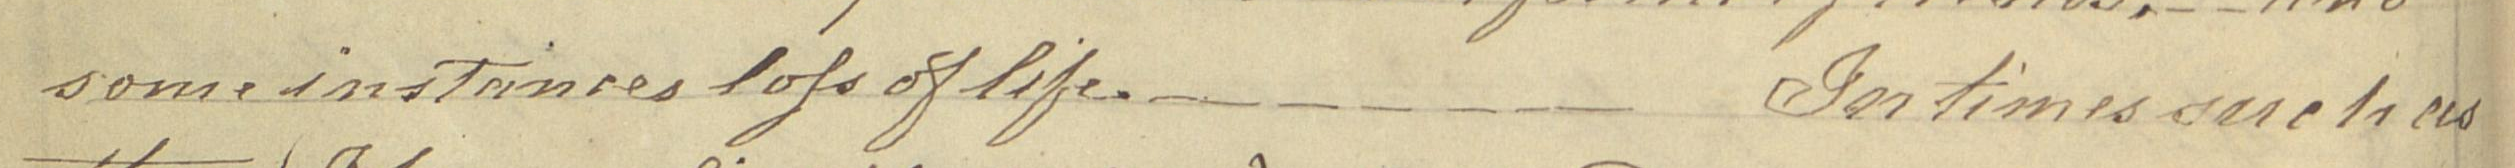some instances loss of life. In times such as
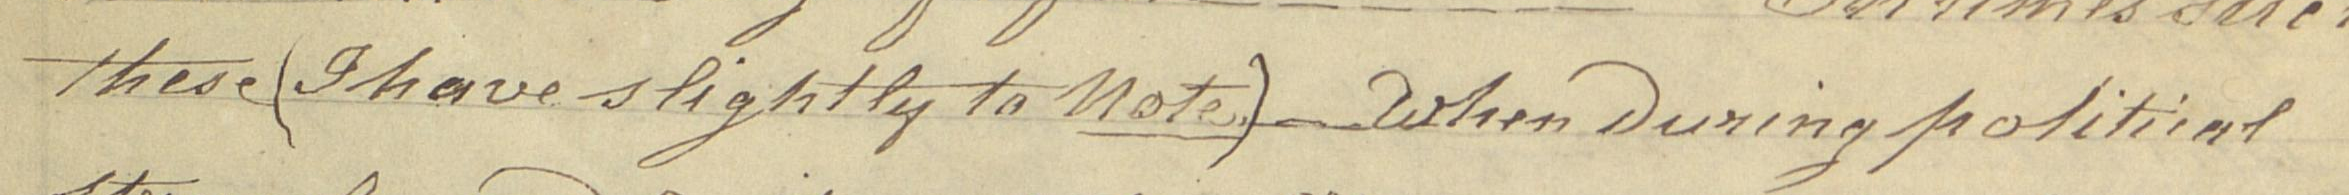these (I have slightly to Note) When during political
